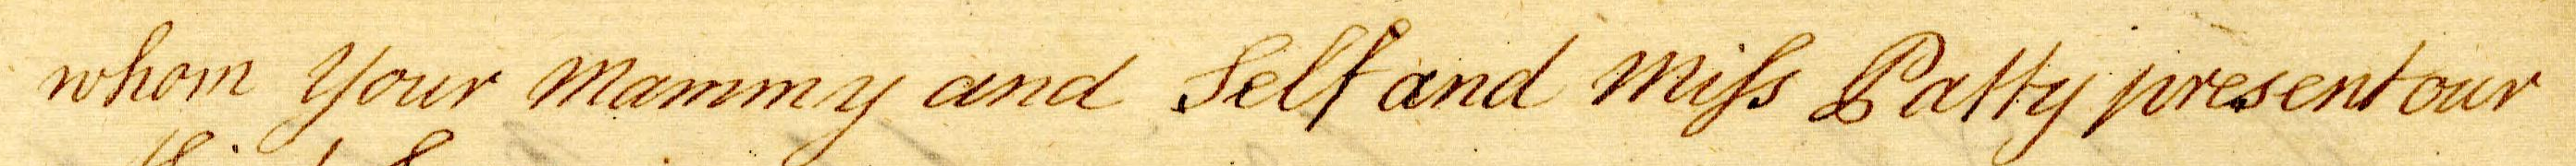whom Your Mammy and Self and Miss Patty present our
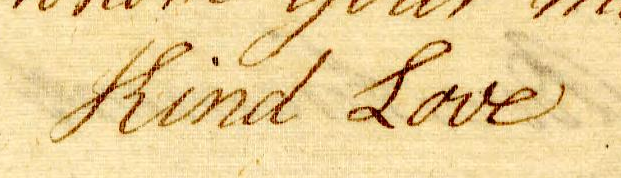Kind Love
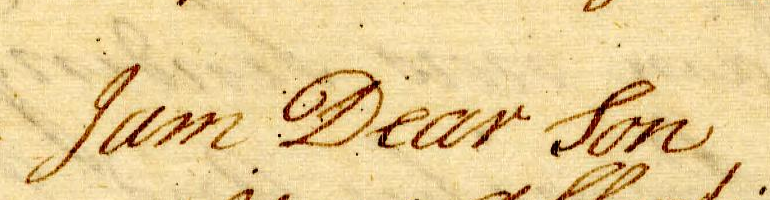I am Dear Son
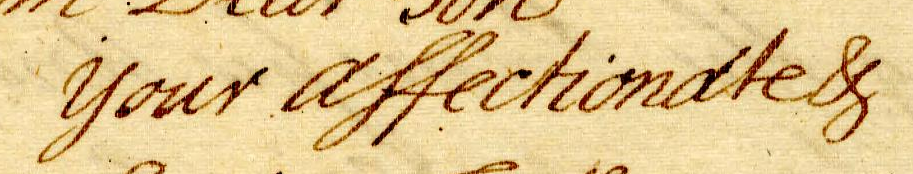Your affectionate &
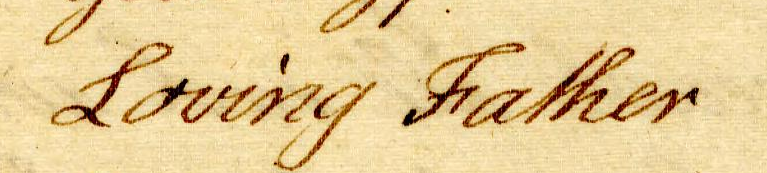Loving Father
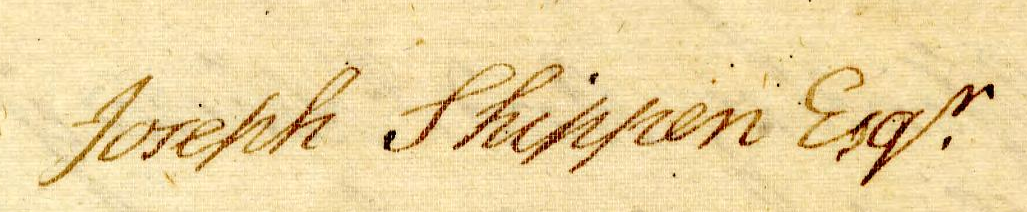Joseph Shippen Esq^r.
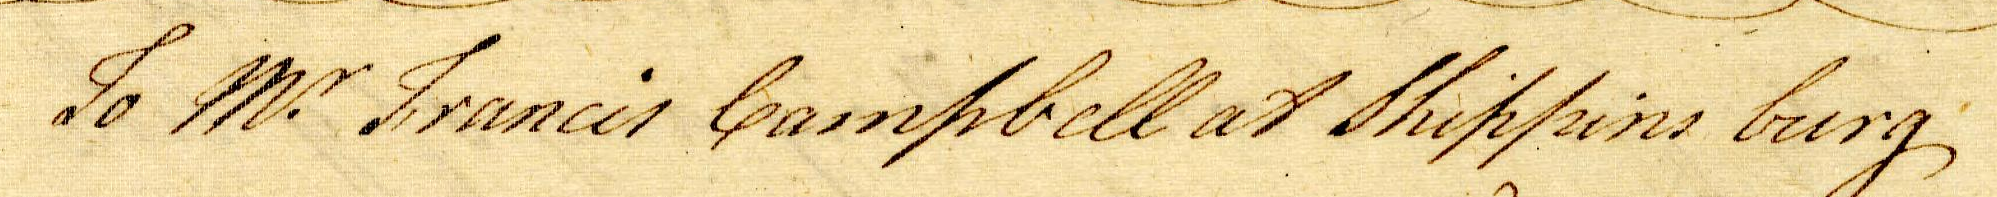To M^r. Francis Campbell at Shippinsburg
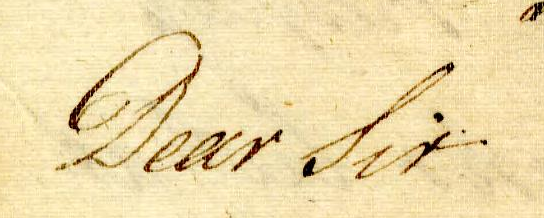Dear Sir
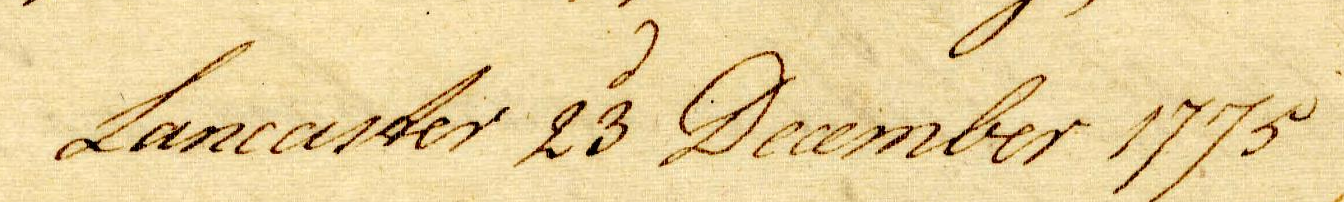Lancaster 23^d December 1775
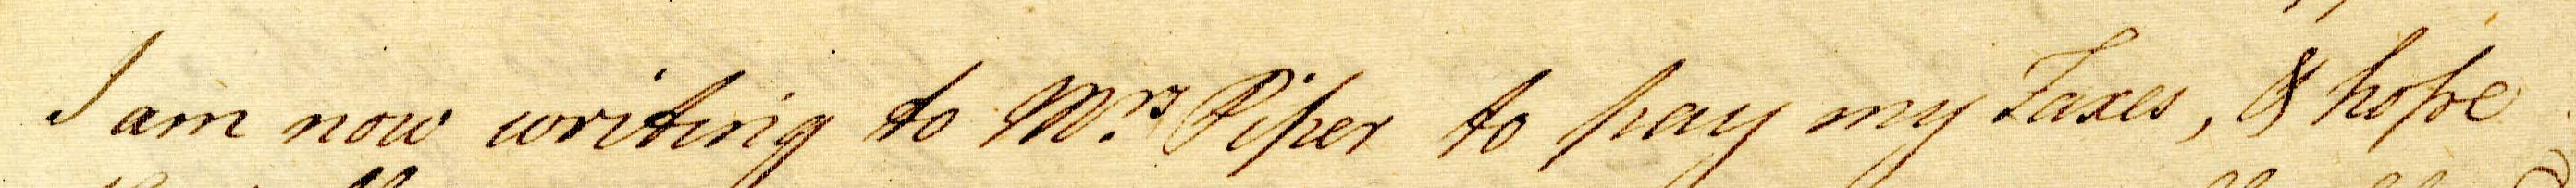I am now writing to M^rs. Piper to pay my Taxes, & hope
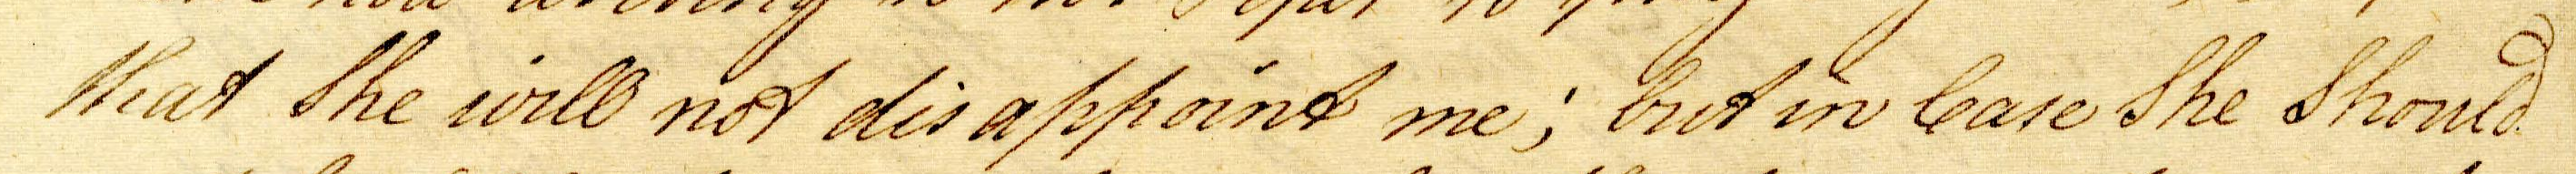That She will not disappoint me; but in Case She Should
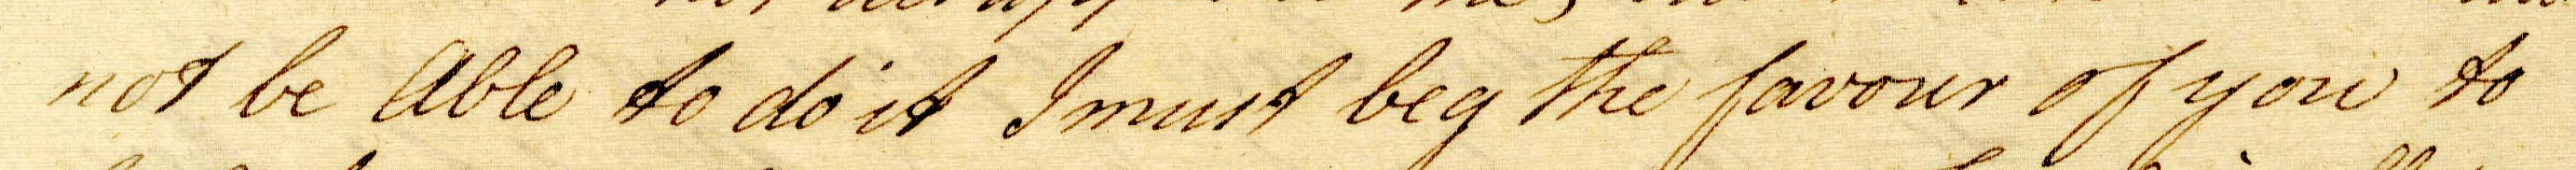not be Able to do it I must beg the favour of you to
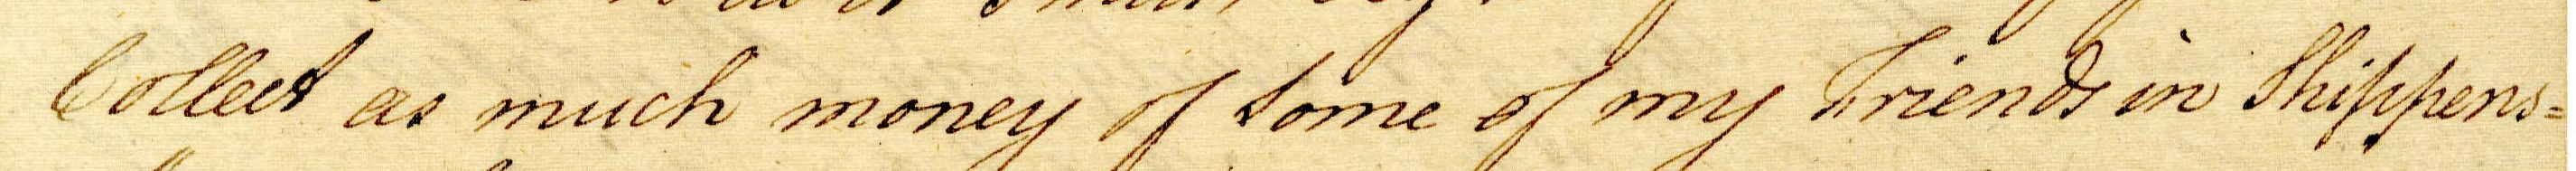Collect as much money of Some of my Friends in Shippens-
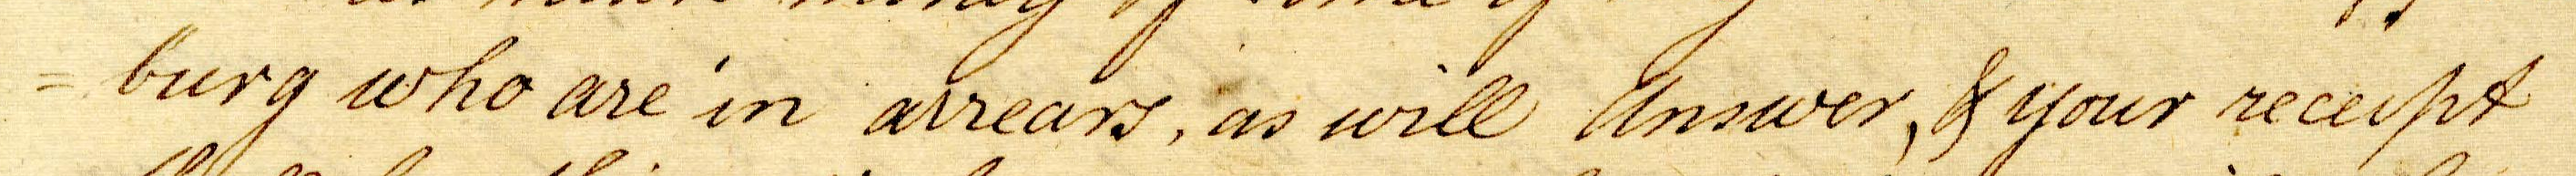-burg who are in arrears, as will Answer, & your receipt
